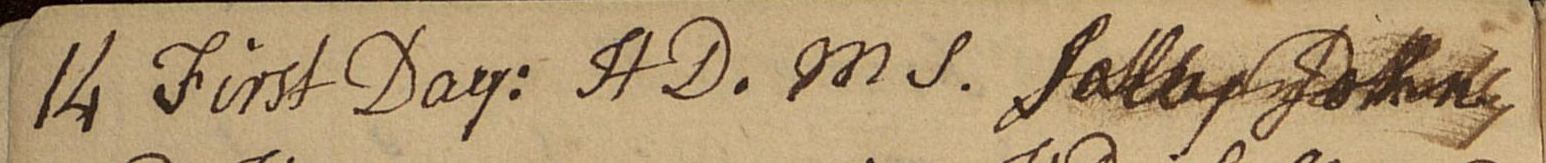14 First Day: H D. M S. [Sally John]
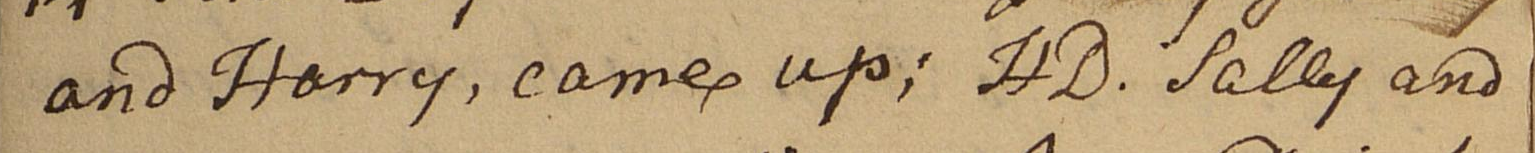and Harry, came up; H D. Sally and
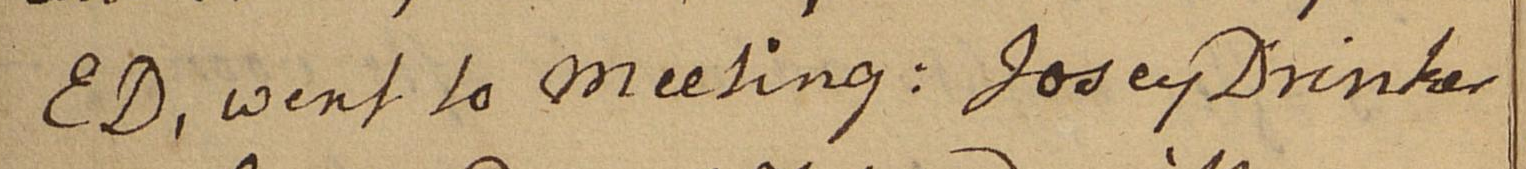ED. went to meeting: Josey Drinker
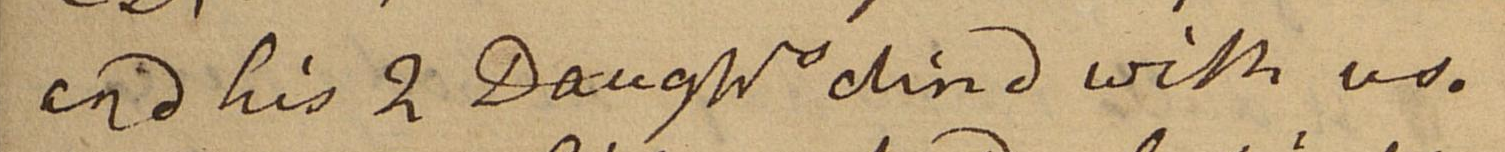and his 2 Daugh^s dind with us.
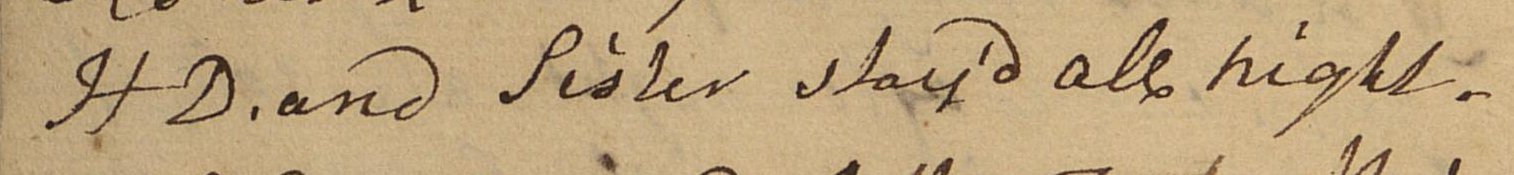HD. and Sister stay'd all night.
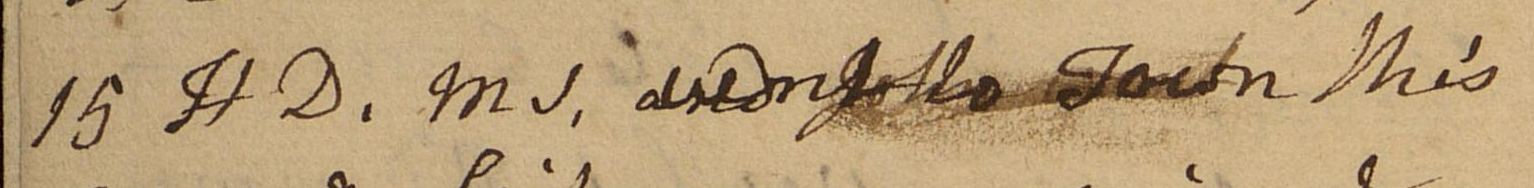15 H D. MS, [____] go to Town this
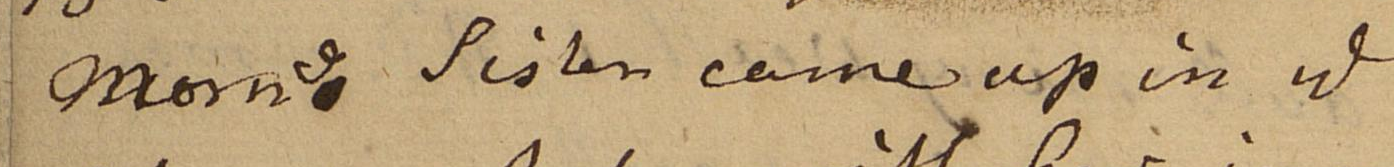Morn^g. Sister came up in y^e
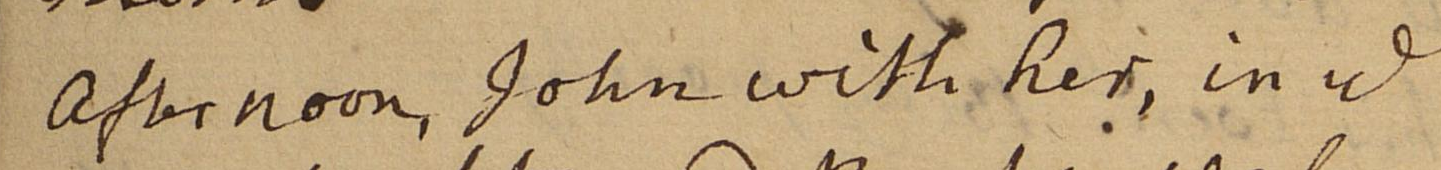Afternoon, John with her, in y^e
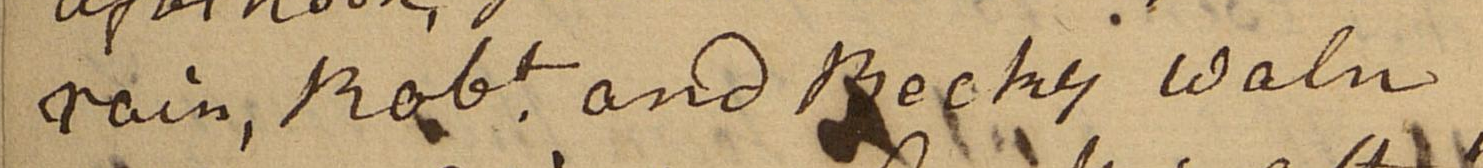rain, Rob^t. and Becky Waln
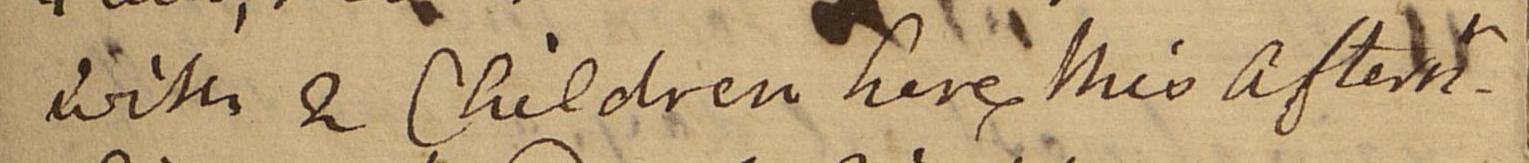with 2 Children here this aftern^n-
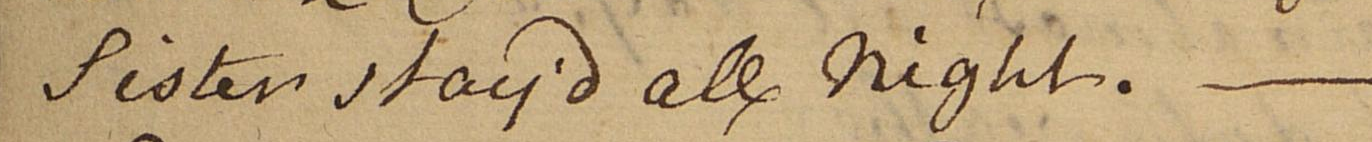Sister stay'd all Night.-
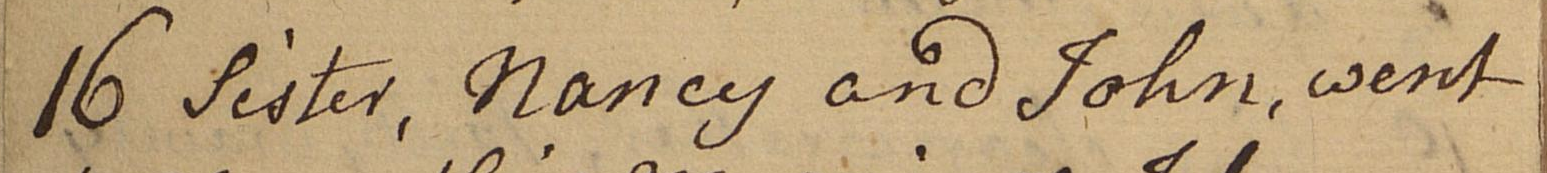16 Sister, Nancy and John, went
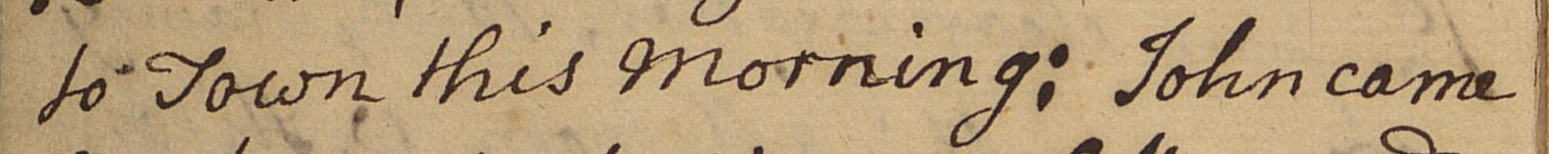to Town this Morning: John came
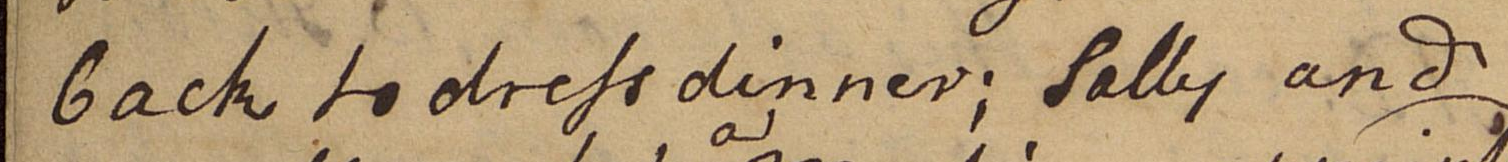back to dress dinner; Sally and
